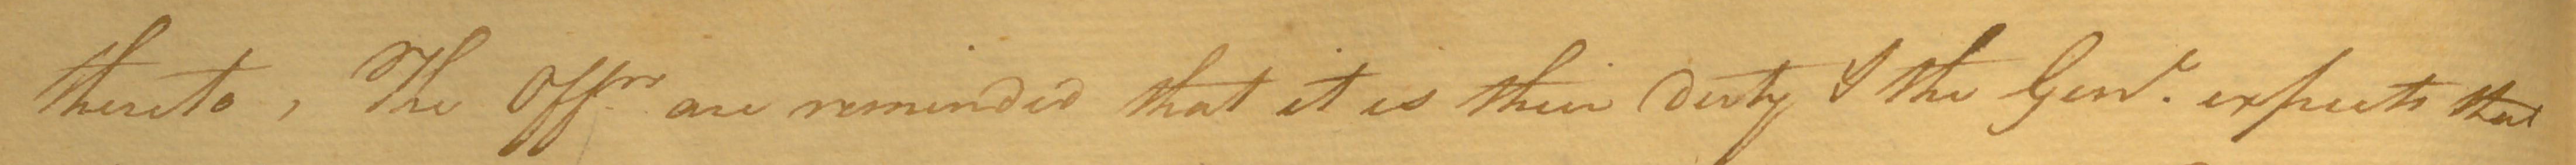thereto, The Off^rs are reminded that it is their duty & the Gen^l. expects that
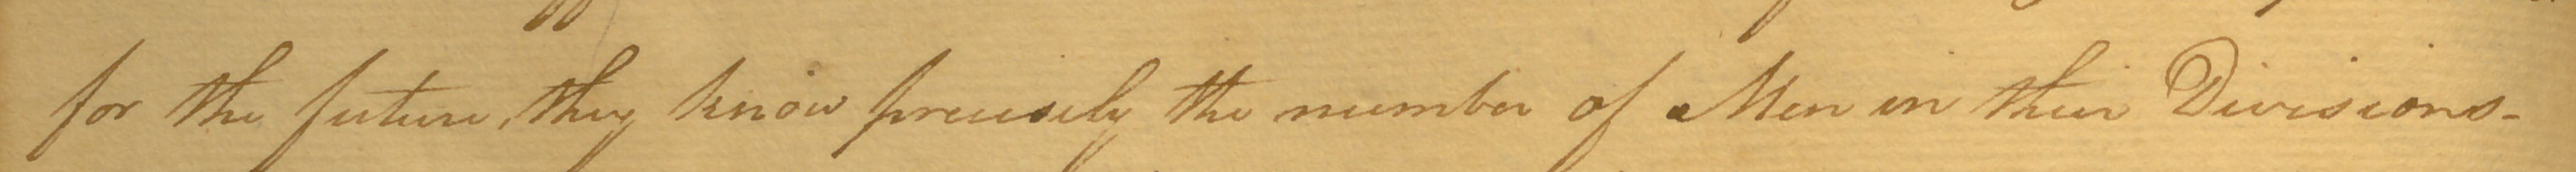for the future they know precisely the number of Men in their Divisions
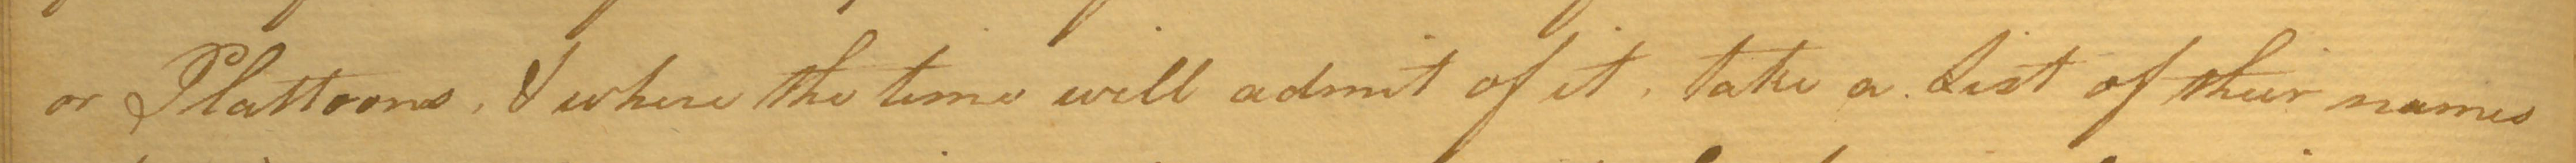or Plattoons, & where the time will admit of it take a List of their names
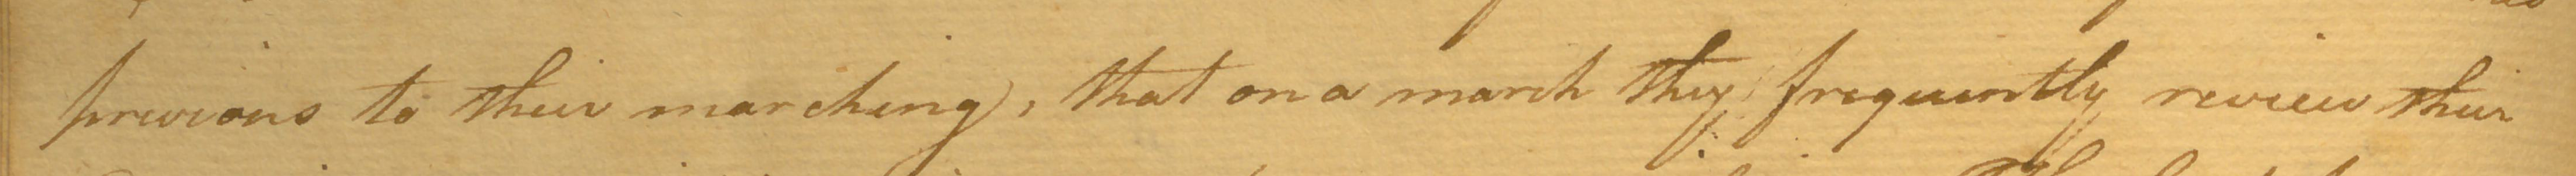previous to their marching, that on a march they frequently review their
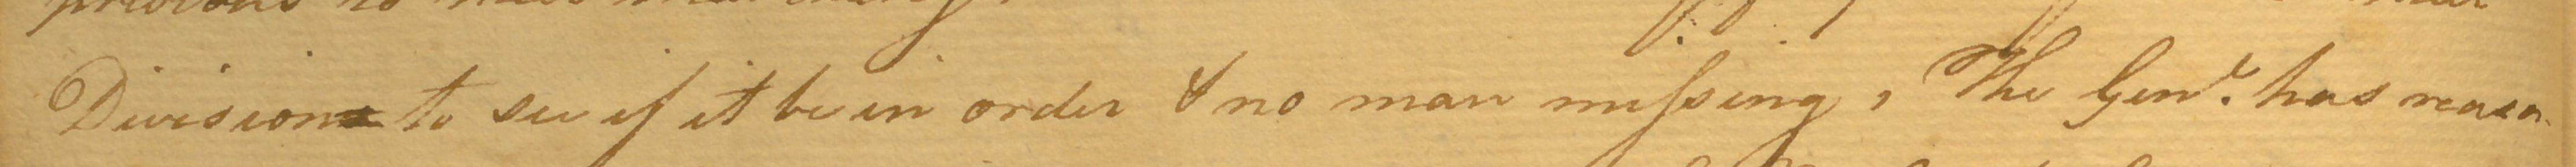Divisions to see if it be in order & no man missing. The Gen^l. has reason
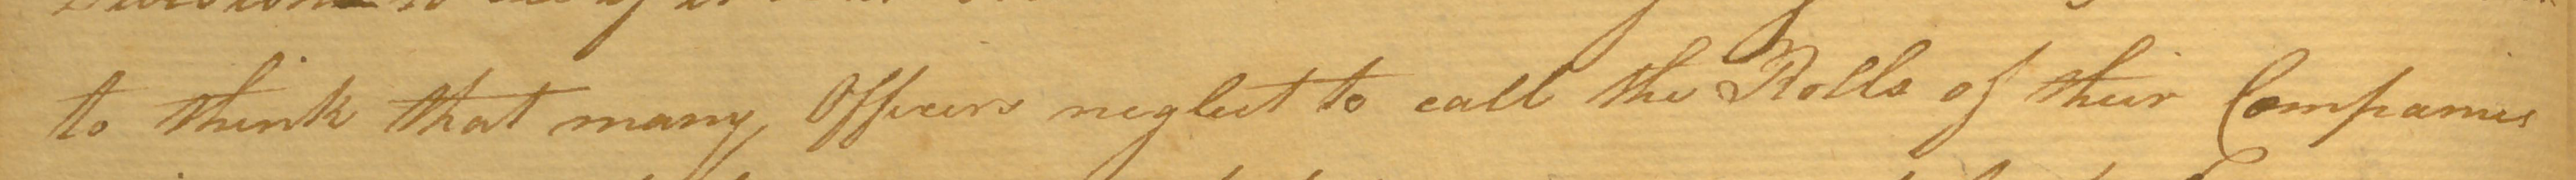to think that many Officers neglect to call the Rolls of other Companies
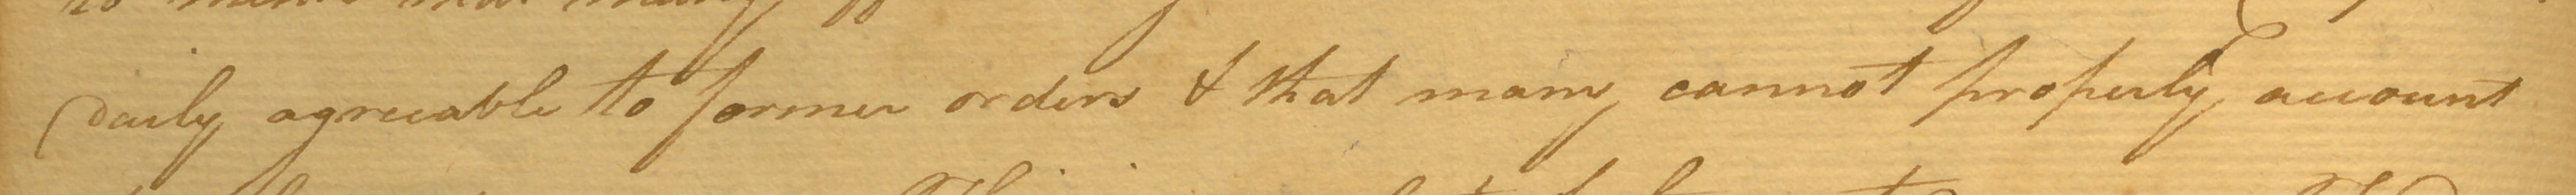daily agreeable to former orders & that many cannot properly account
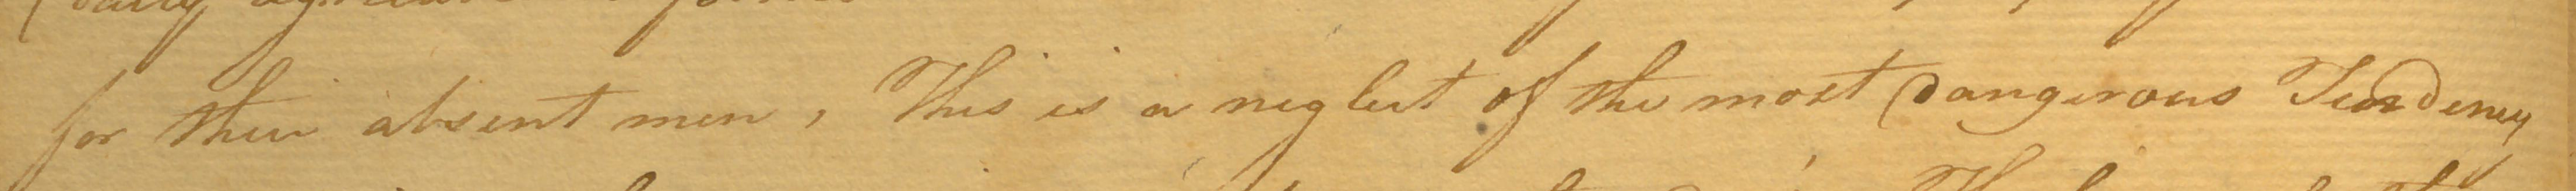for their absent men, This is a neglect of the most dangerous Tendency
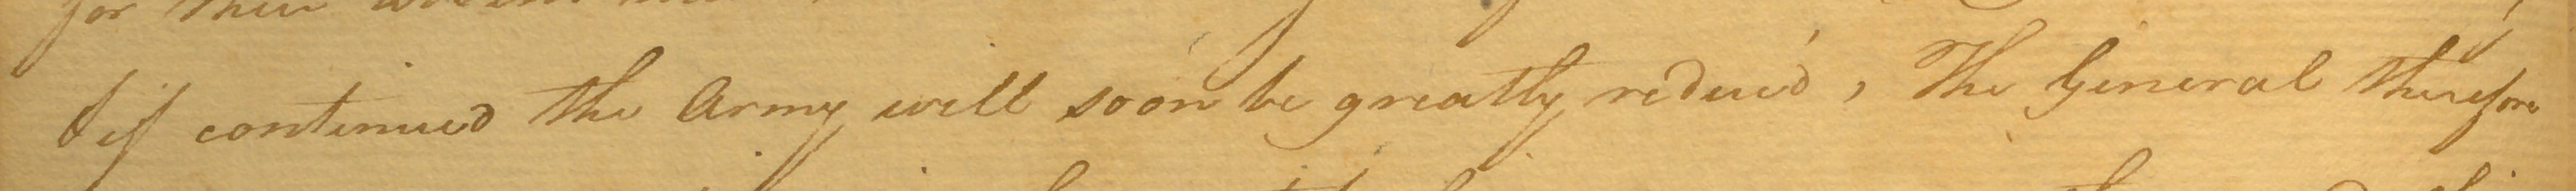& if continued the Army will soon be greatly reduc'd, The General therefore
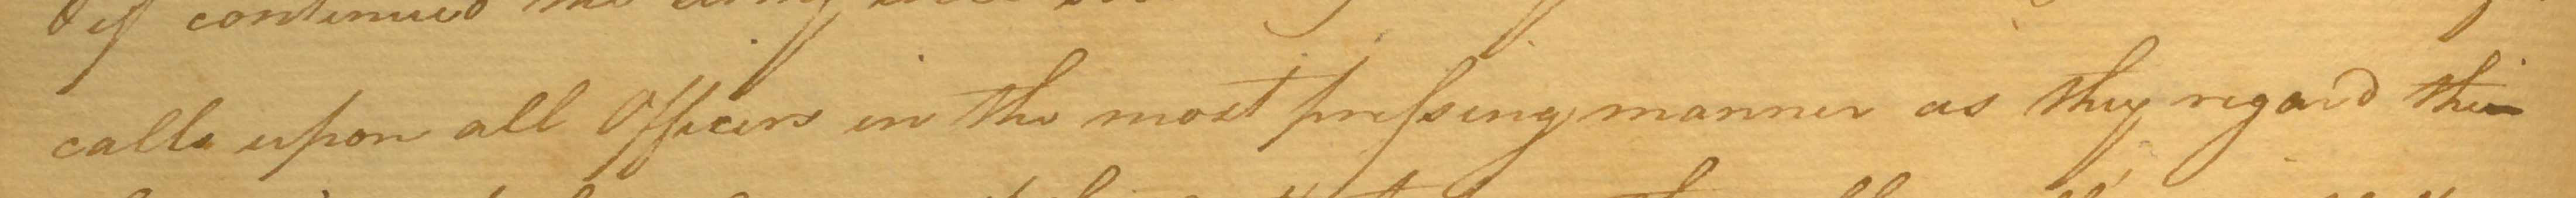calls upon all Officers in the most pressing manner as they regard the
